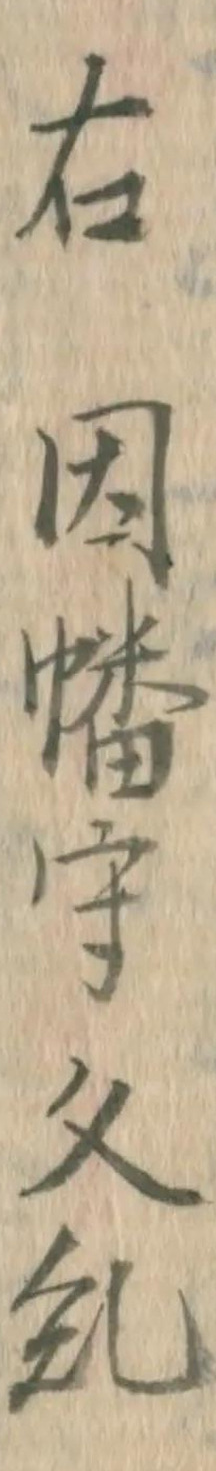右因幡守久糺
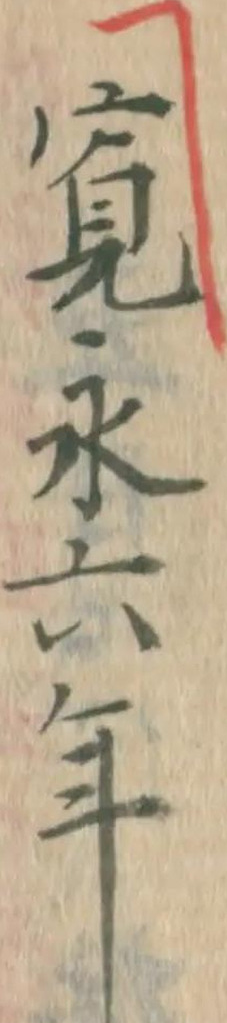寛永六年

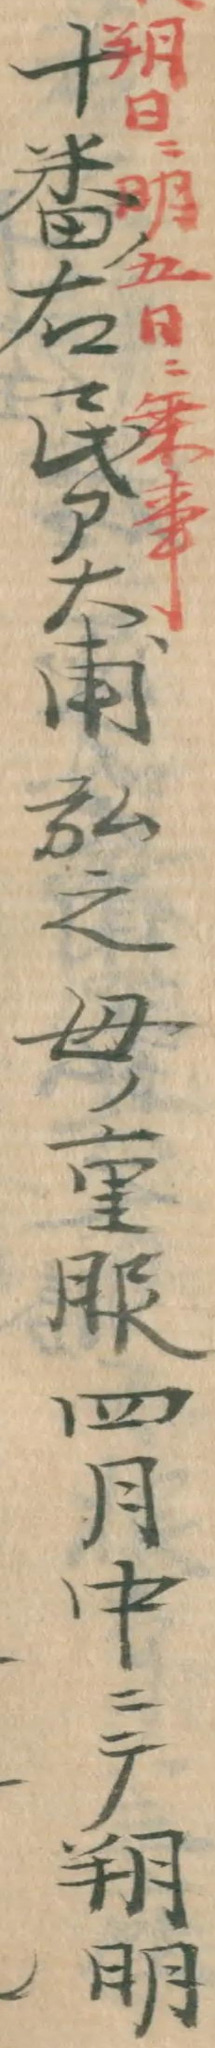十番右民部大輔弘之母ノ重服四月中ニテ朔明
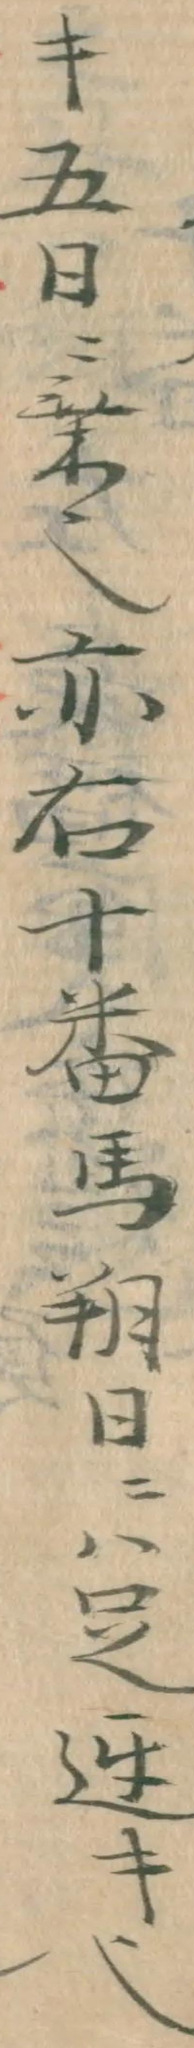キ五日ニ乗也亦右十番馬朔日ニハ足遅キ也
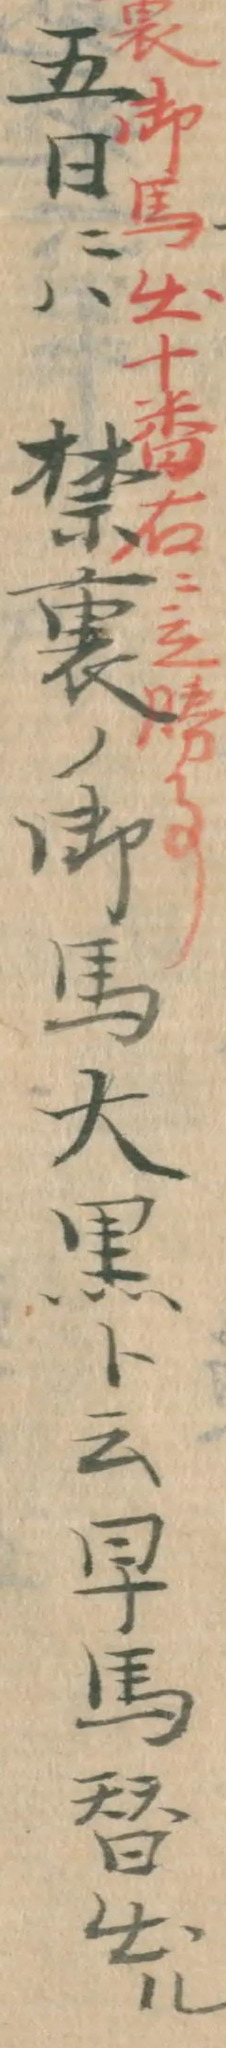五日ニハ禁裏ノ御馬大黒ト云早馬替出ル
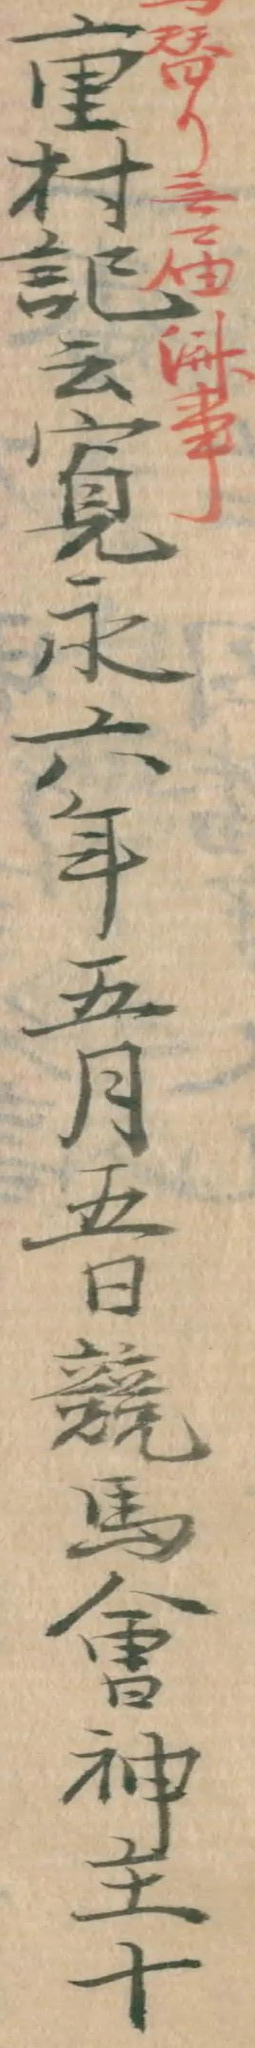重村記云寛永六年五月五日競馬会神主十
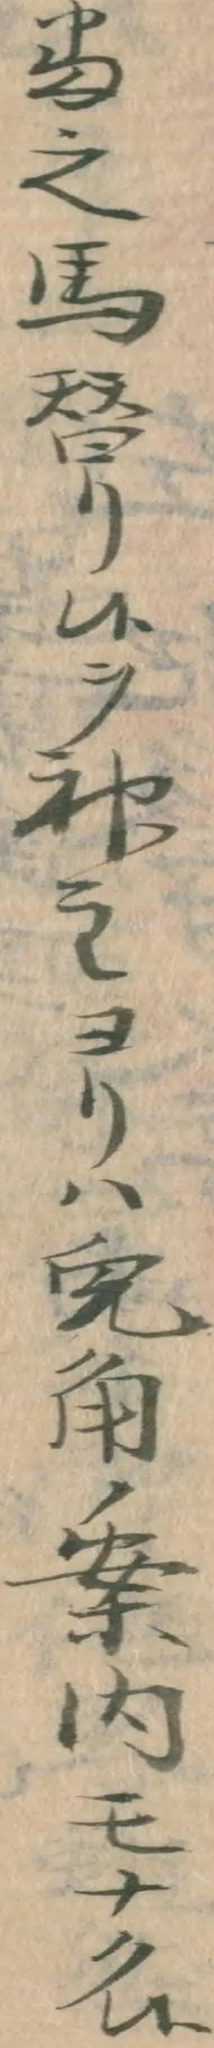番之馬替リ候ヲ神主ヨリハ兎角ノ案内モナク候
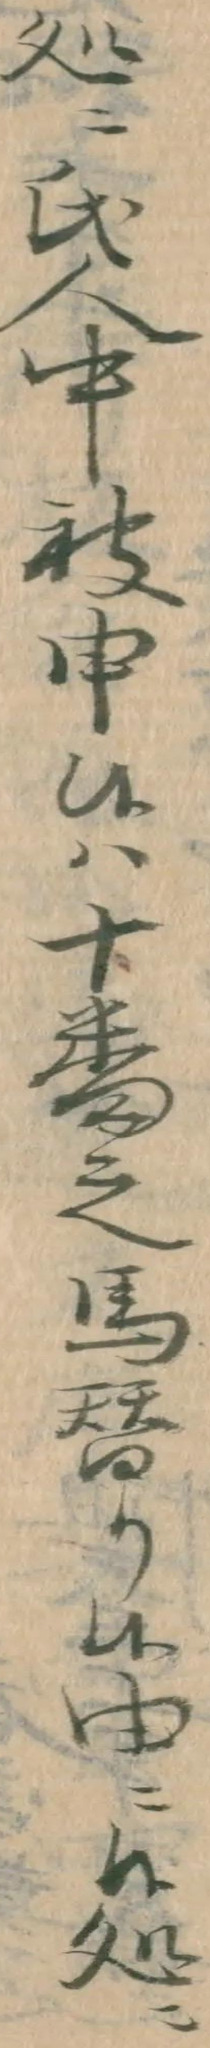処ニ氏人中被申候ハ十番之馬替リ候由ニ候処ニ
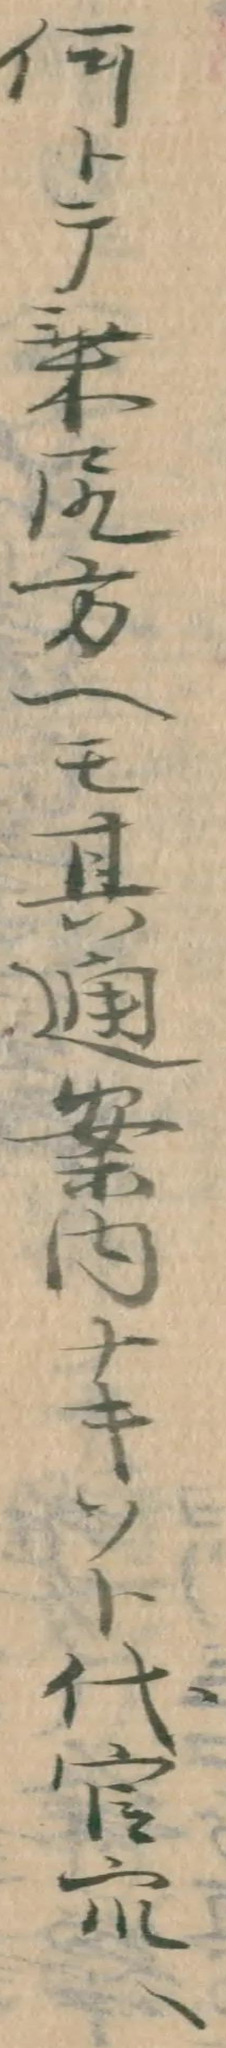何トテ乗尻方へモ其通案内ナキソト代官衆ヘ
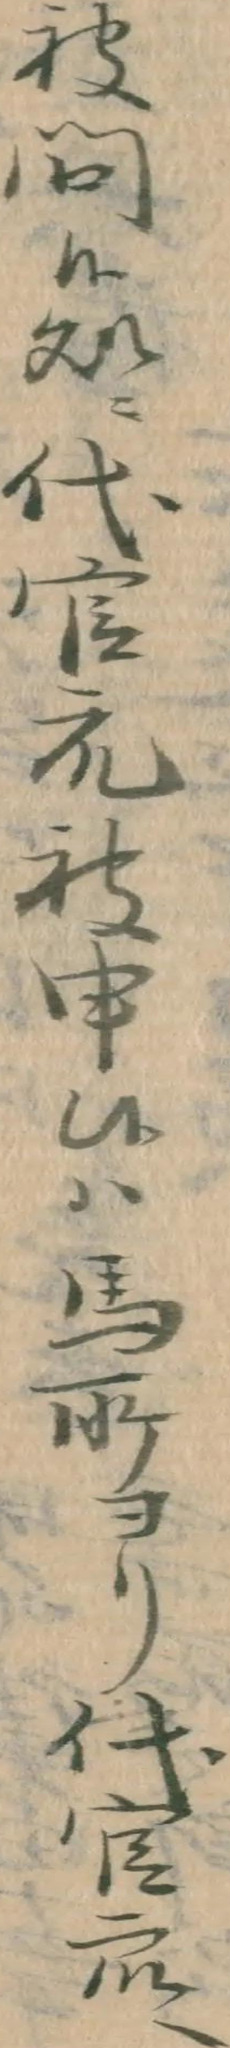被問候処ニ代官衆被申候ハ馬所ヨリ代官衆へ
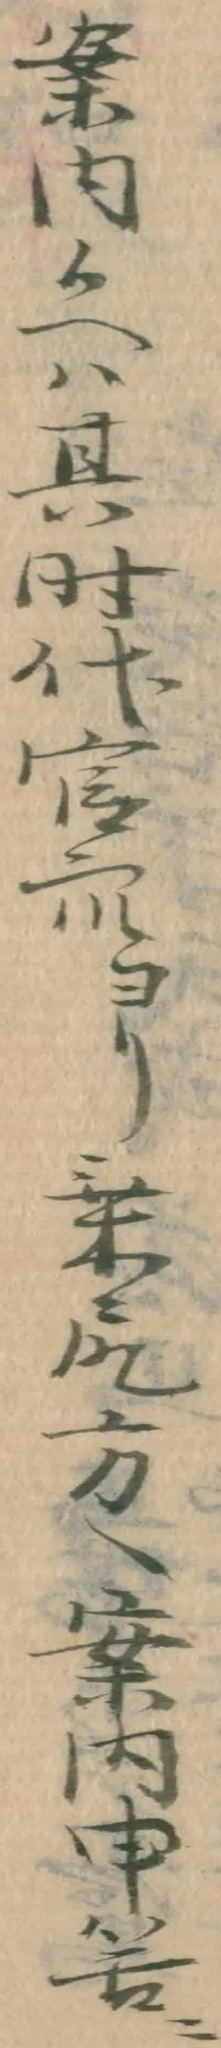案内候ヘハ其時代官衆ヨリ乗尻方へ案内申筈ニ
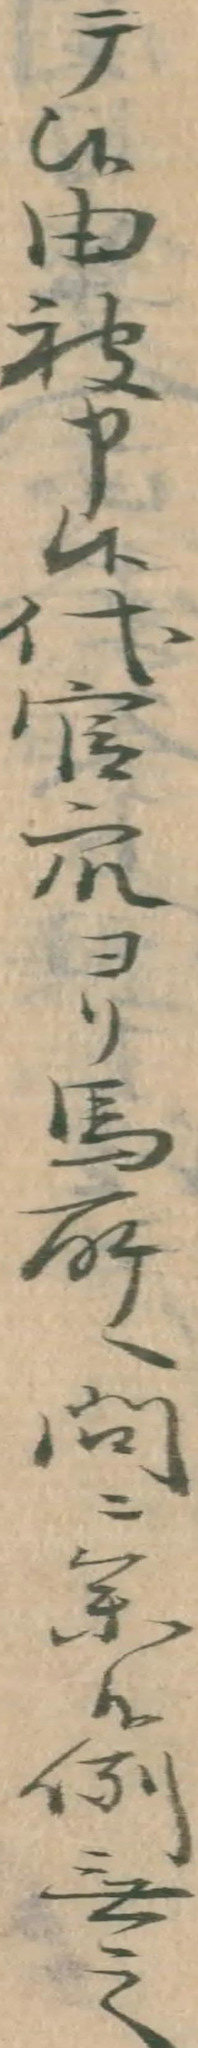テ候由被申候代官衆ヨリ馬所へ問ニ参候例無之
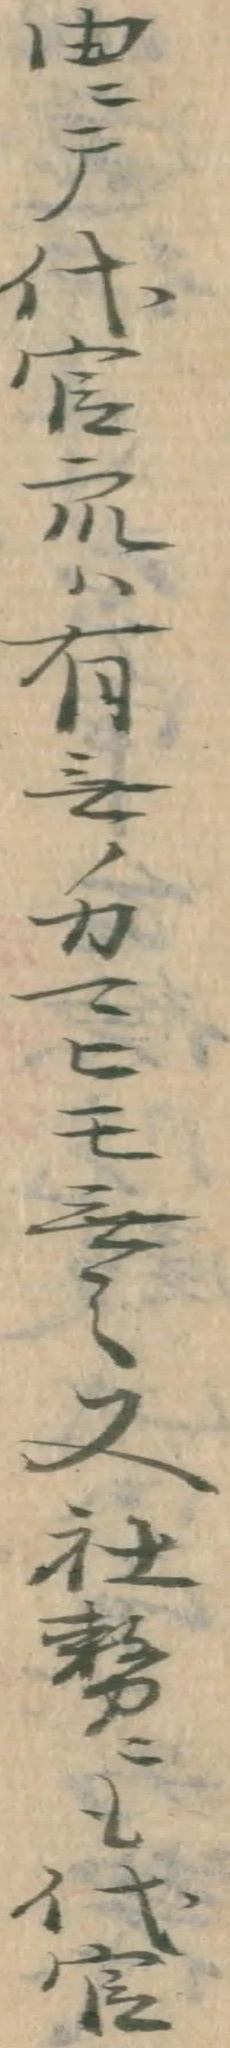由ニテ代官衆ハ有無ノカマヒモ無之又社務ニも代官
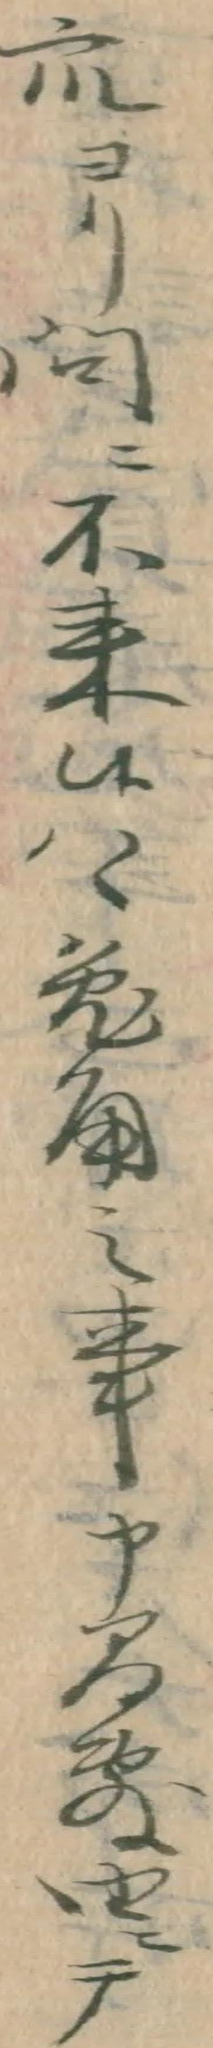衆ヨリ問ニ不来候ハヽ兎角之事申間敷由ニテ
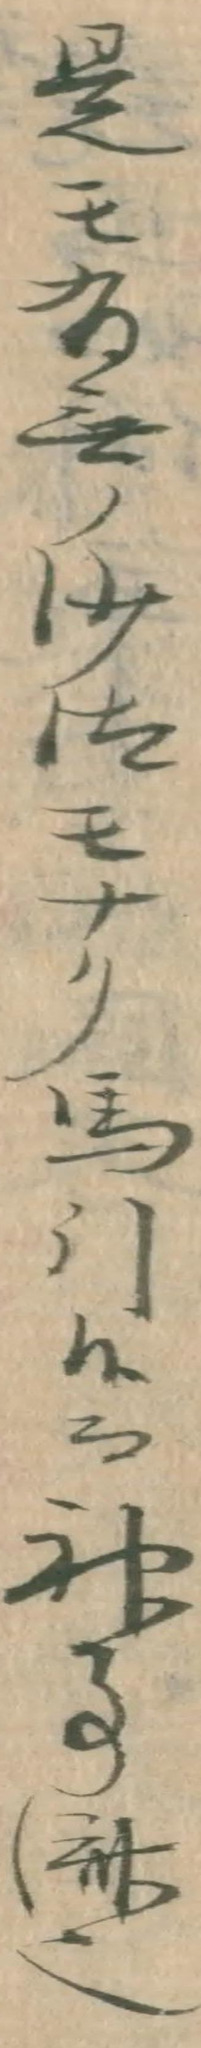是モ有無ノ沙汰モナリ馬引候而神事済也
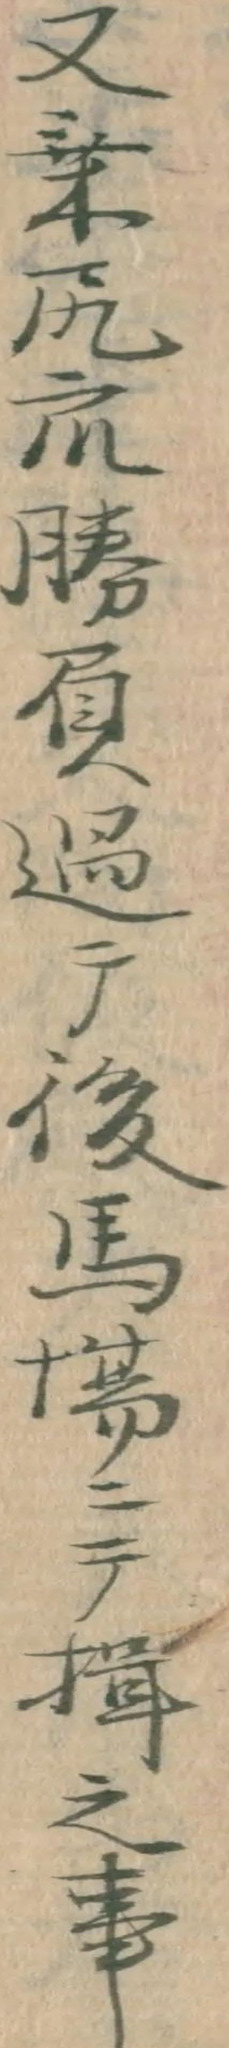又乗尻衆勝負過テ後馬場ニテ揖之事
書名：賀茂社記録. 第10冊
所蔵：国立国会図書館 National Diet Library, JAPAN
